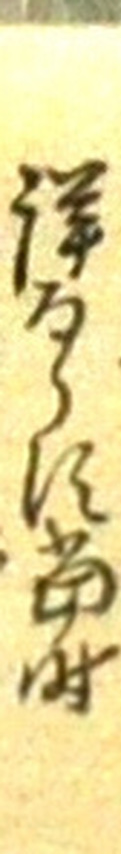詳ならす当時
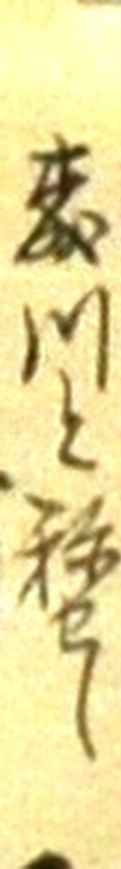森川と称せし
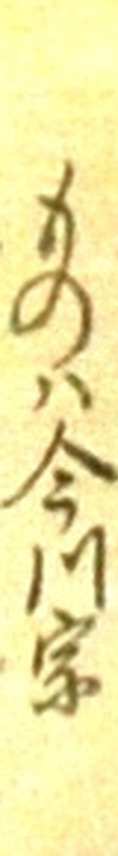ものは今川宗
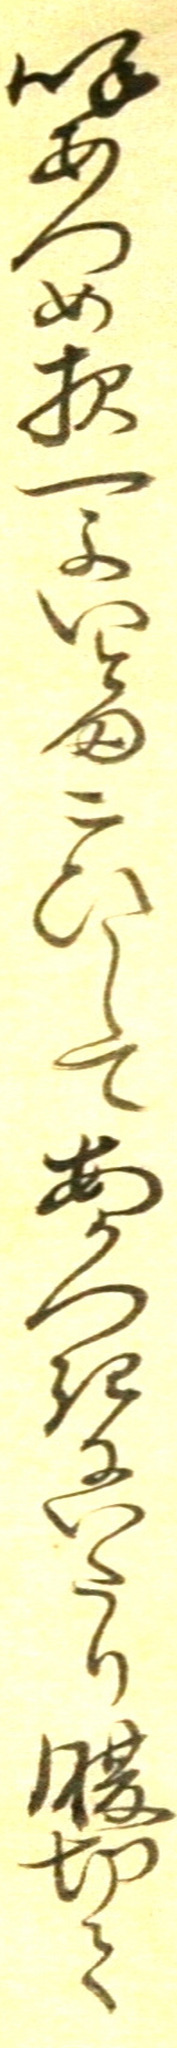呼あつめ夜一よいとまこひしてあかつきにいたり腹切て
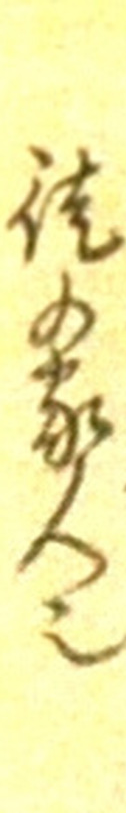徒の家人也

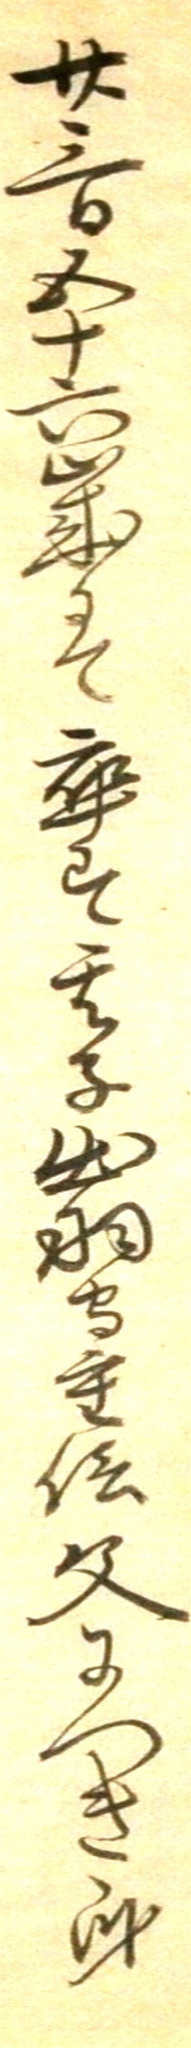廿三日五十六歳にて卒す其子出羽守重信父につき身
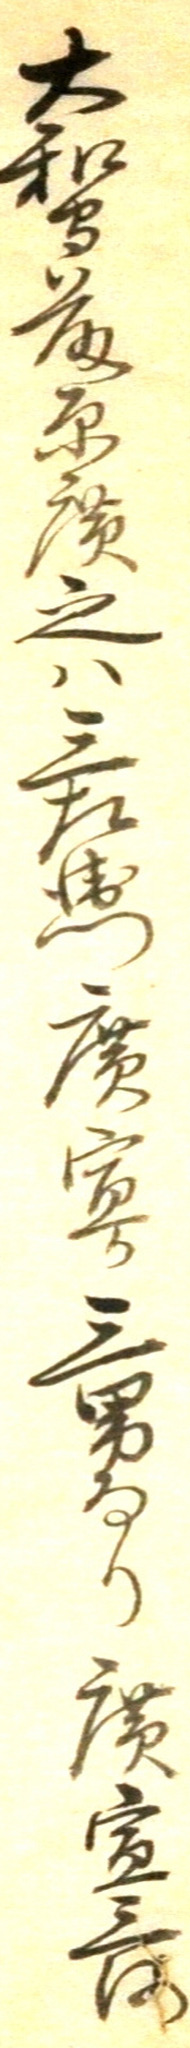大和守藤原広之は三左衛門広宣か三男なり広宣三河
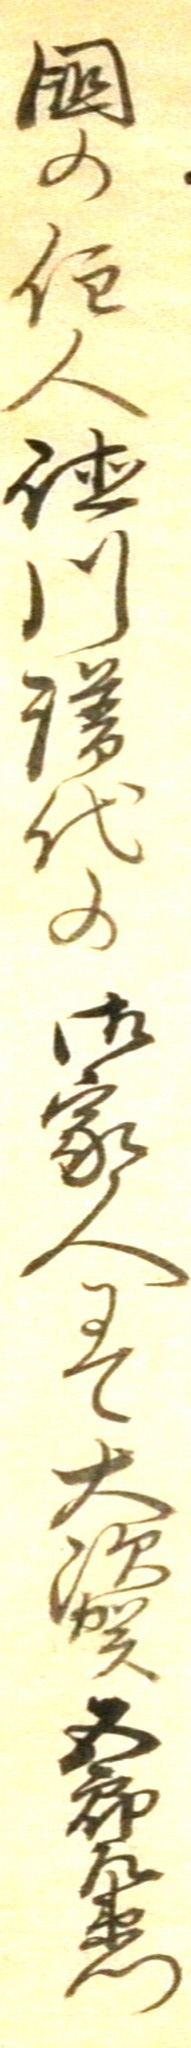国に住人徳川譜代の御家人にて大須賀五郎左衛門
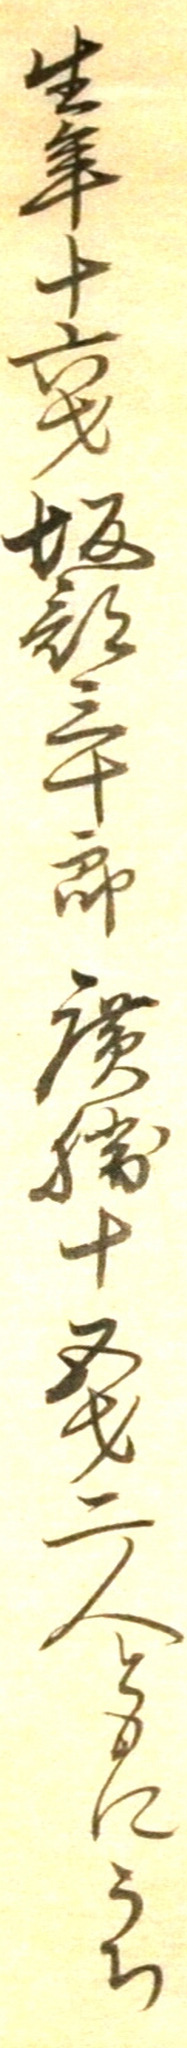生年十六才坂部三十郎広勝十五才二人ともにうち
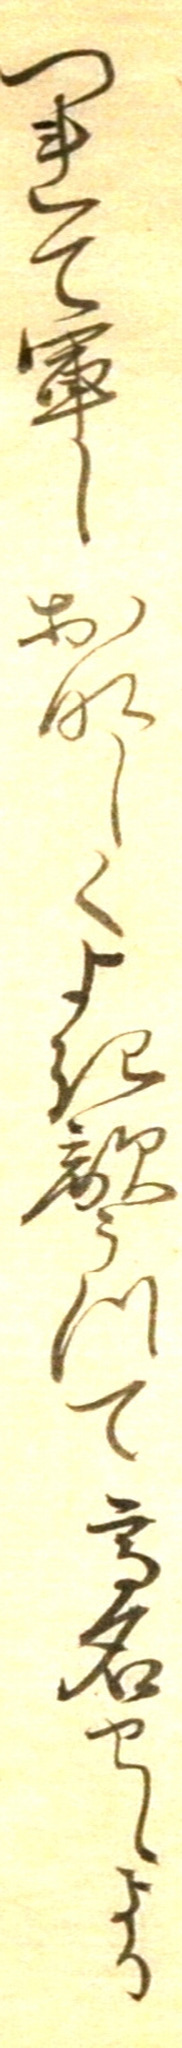つれて軍しおなしくよき敵うつて高名せしより
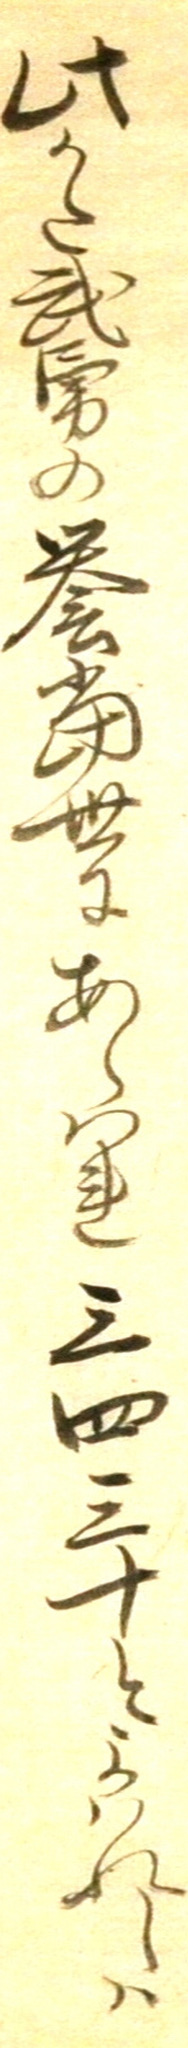此かた武勇の誉当世にあらはれ三四三十とよはれしは
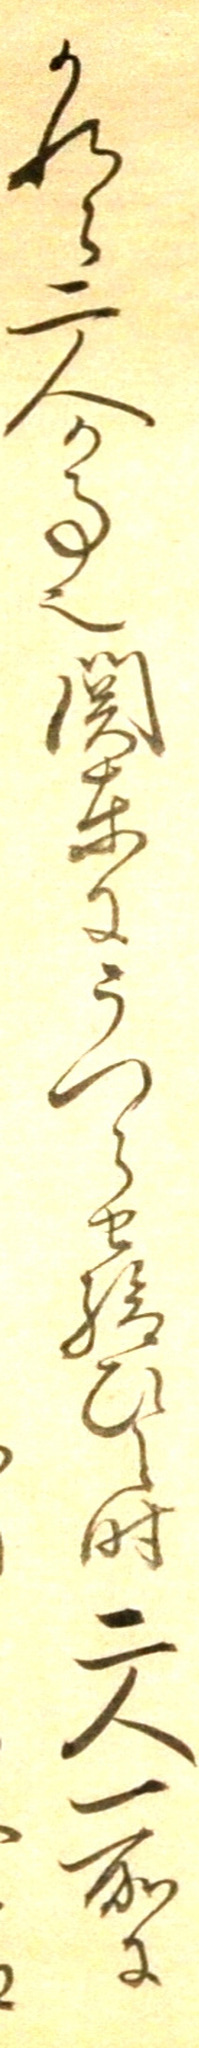かれら二人か事也関東にうつらせ給ひし時二人一所に
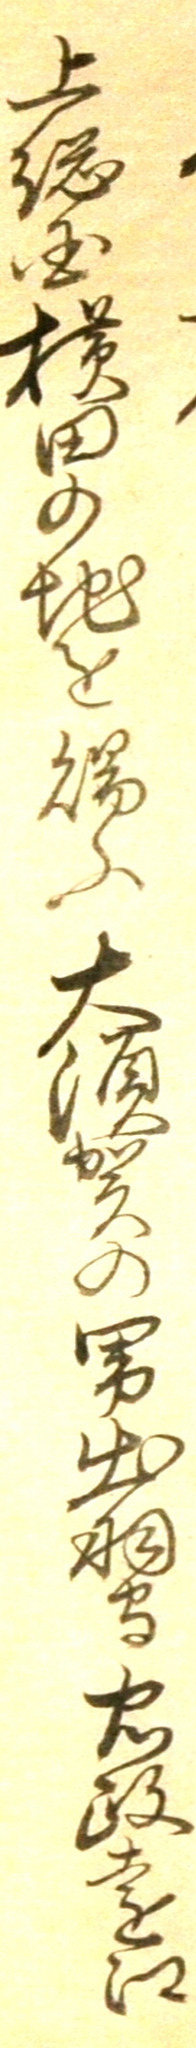上総国横田の地を賜ふ大須賀の男出羽守忠政遠江
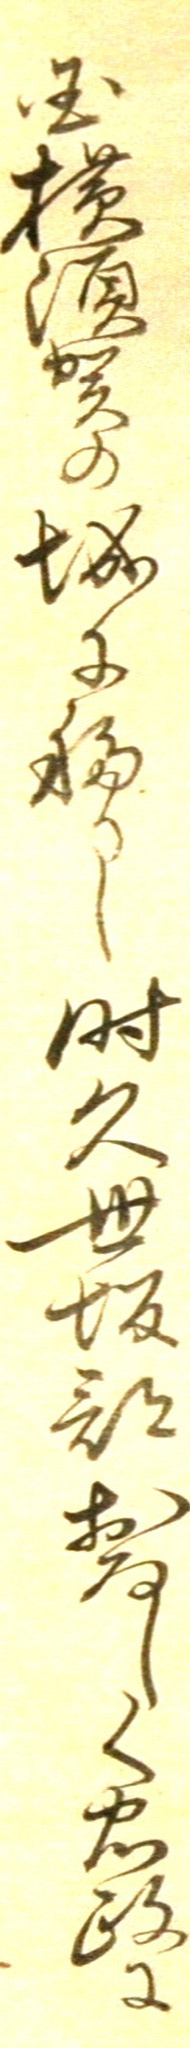国横須賀の城に移りし時久世坂部おなしく忠政に

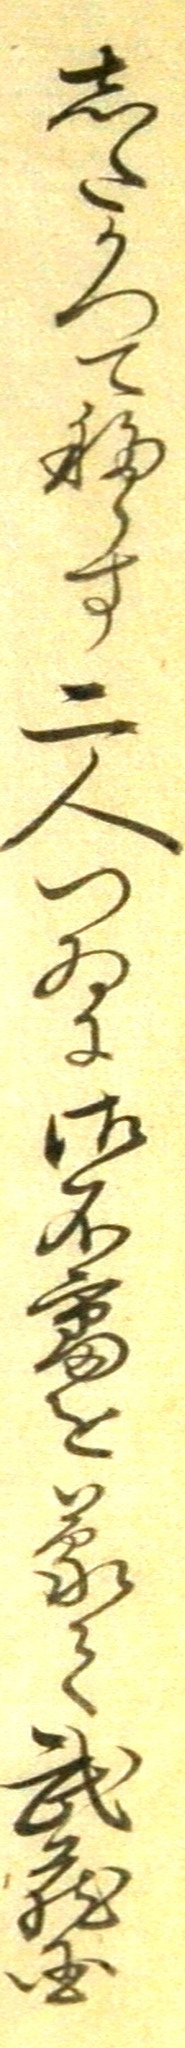したかつて移らす二人つゐに御不審を蒙て武蔵国
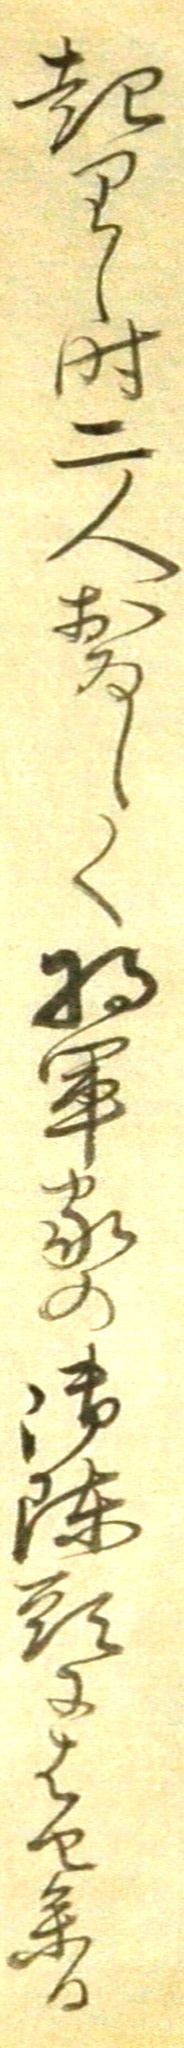起りし時二人おなしく将軍家の御陣頭にはせ参る
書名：藩翰譜（五）
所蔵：伊那市立高遠町図書館・合同会社AMANE
